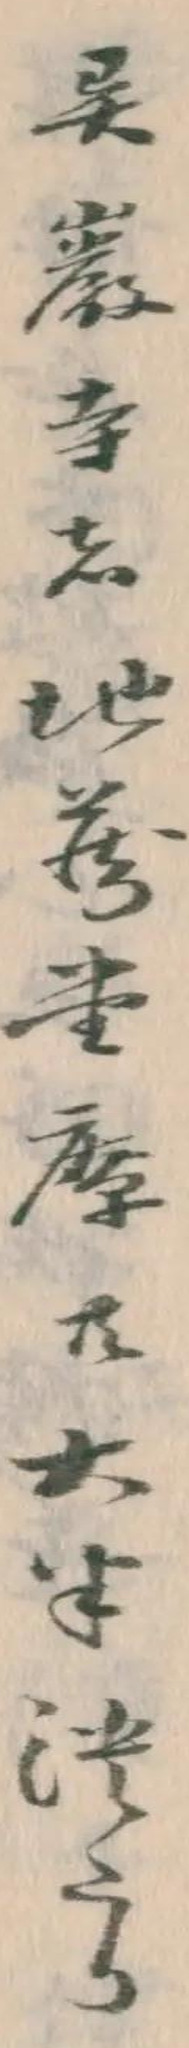霊巖寺は地蔵堂寮共大半潰たり
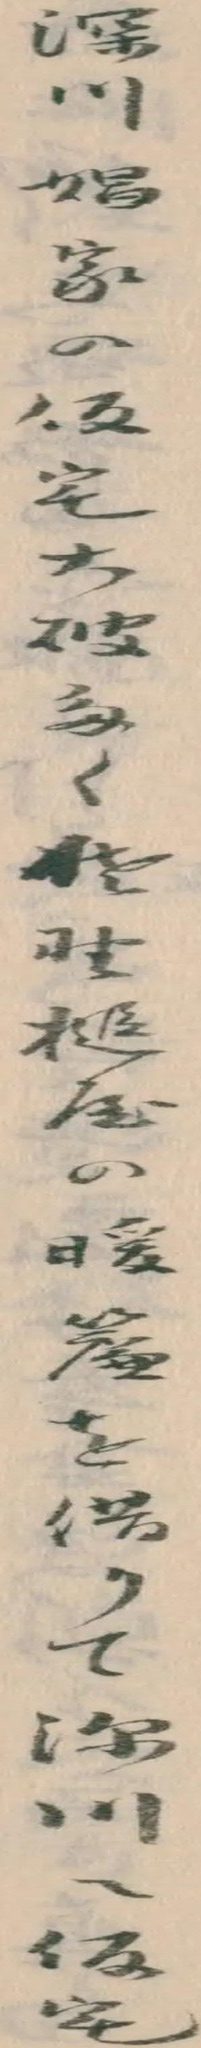深川娼家の仮宅大破多く佐野槌屋の暖簾を借りて深川へ仮宅
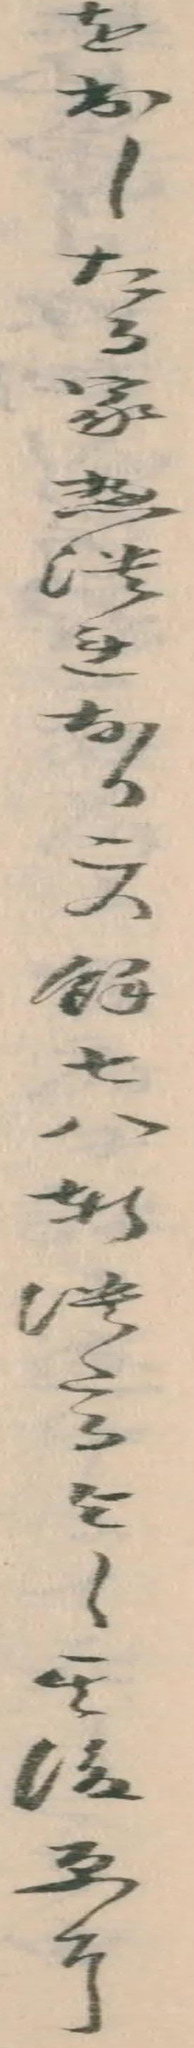を出したる家惣潰れなりこの余七八軒潰たるよし其後更に
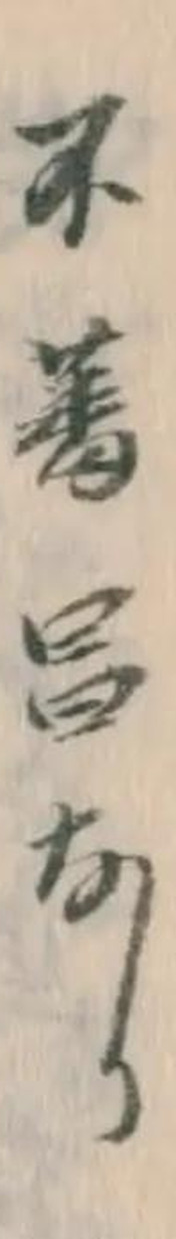不蕃昌なり
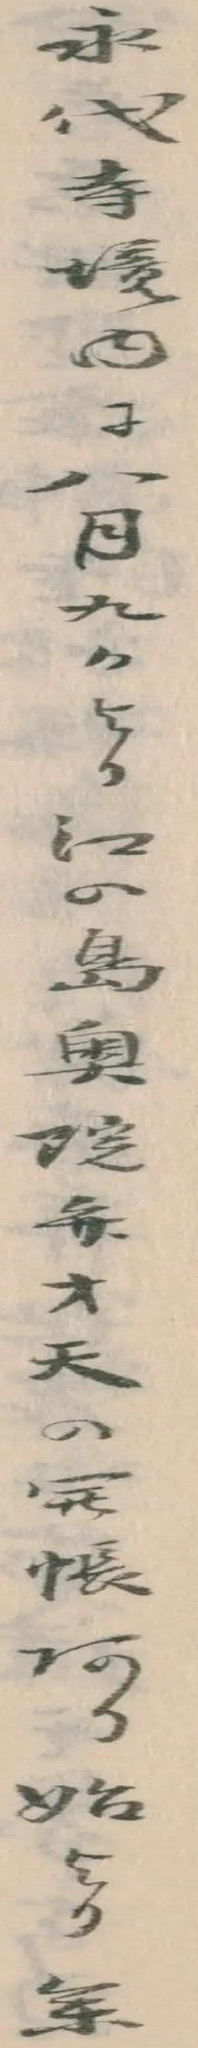永代寺境内に八月九日より江の島奥院弁財天の開帳あり始より参
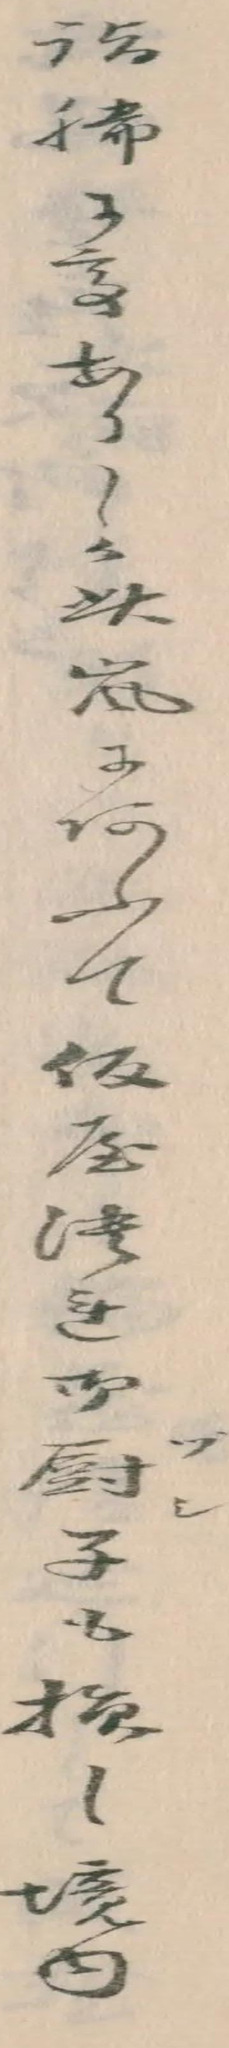詣稀にてありしか此嵐にあふて仮屋潰れ御厨子も損し境内
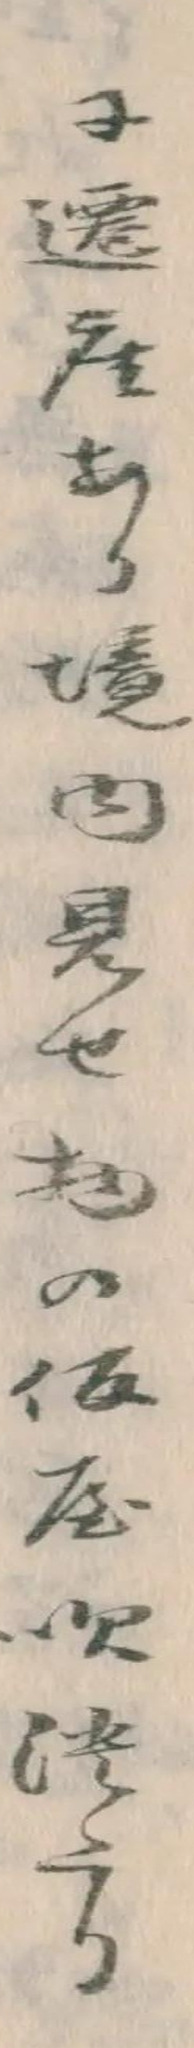に遷座あり境内見せ物の仮屋吹潰たり
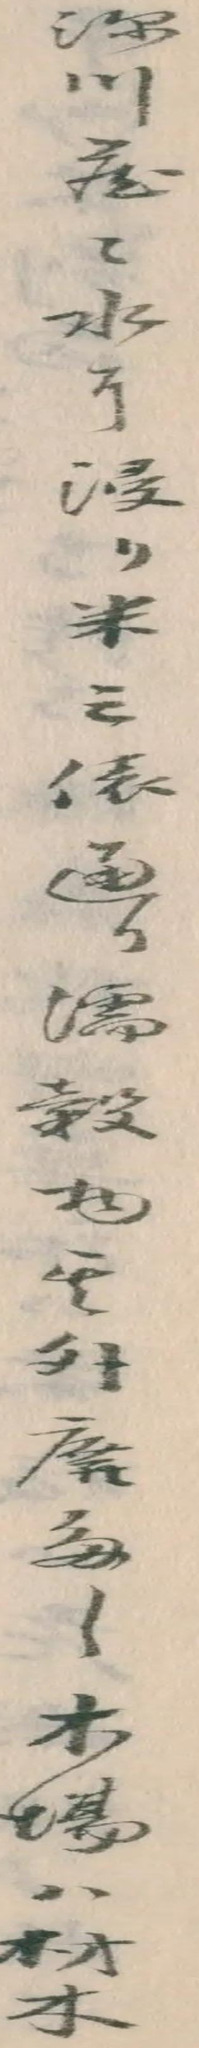深川蔵々水に浸り米之俵通り濡穀物其外廃多し木場は材木
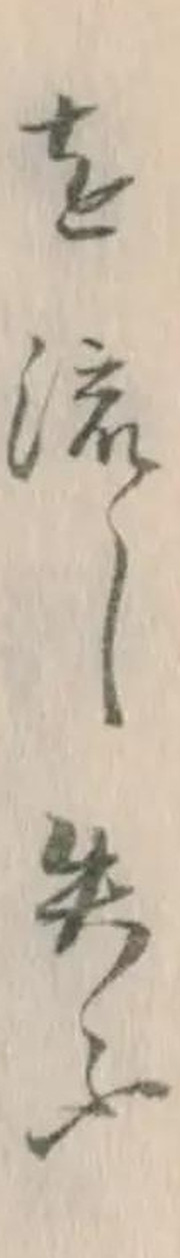を流し失ふ
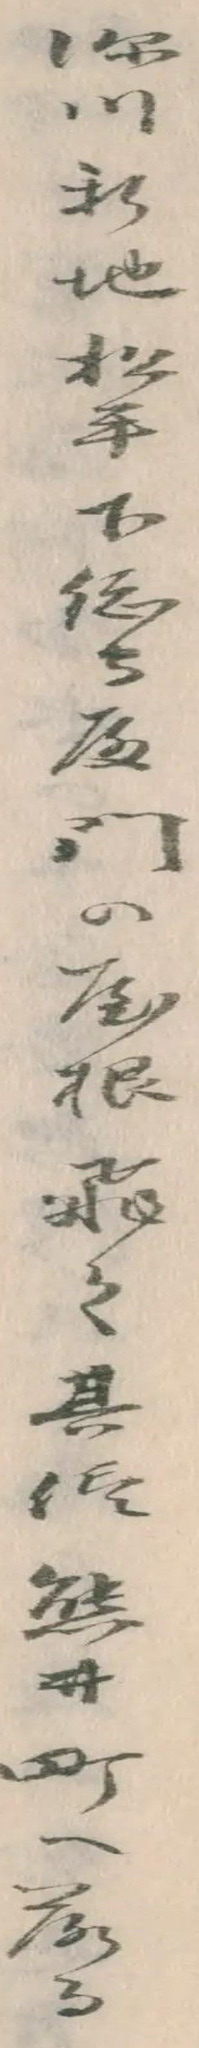深川新地松平下総守殿門の屋根飛て其侭熊井町へ落る
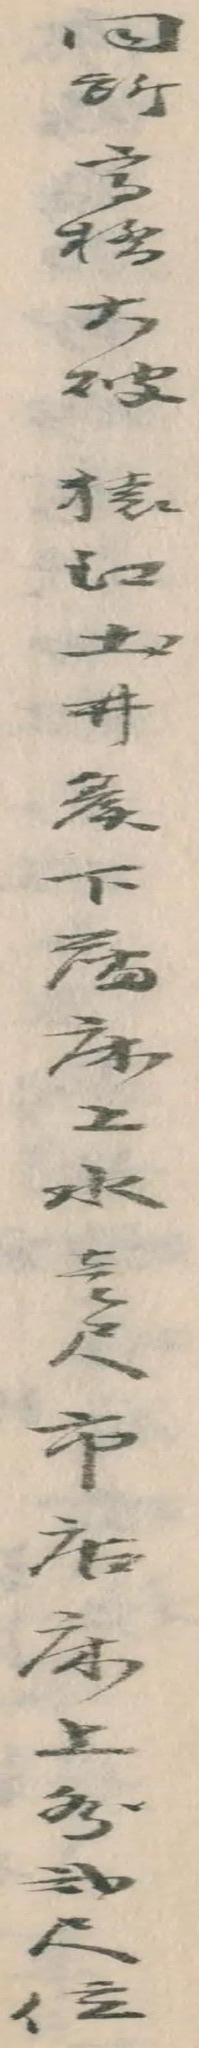同所高橋大破猿江土井侯下藩床上水壱尺市店床上水弐尺位
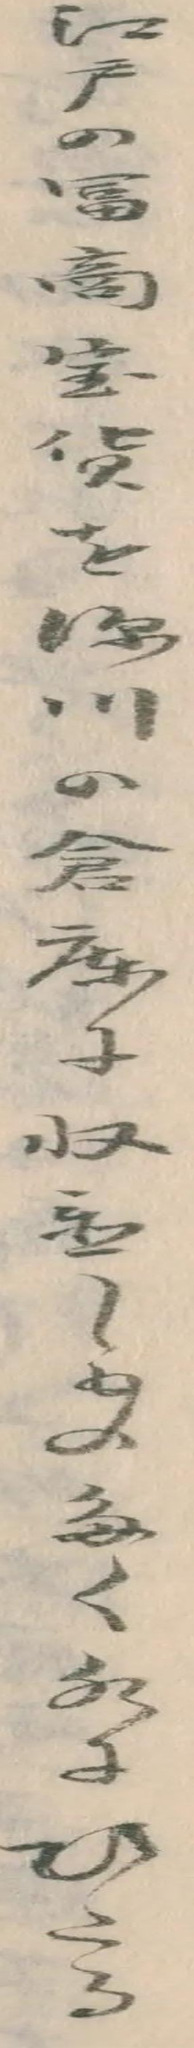江戸の冨商宝貨を深川の倉庫に収置しもの多く水にひたる

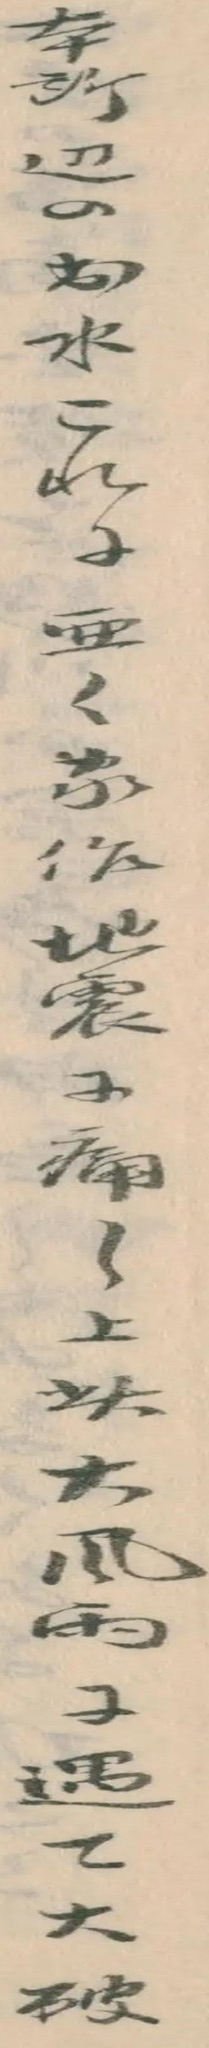本所辺の出水これに亜く家作地震に痛し上此大風雨に遇て大破
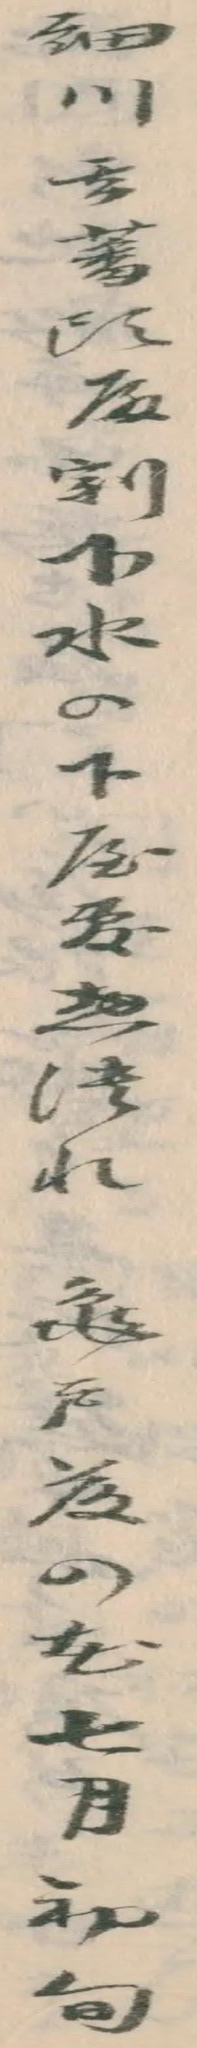細川玄蕃頭殿割下水の下屋敷惣潰れ亀戸藤の花七月初旬
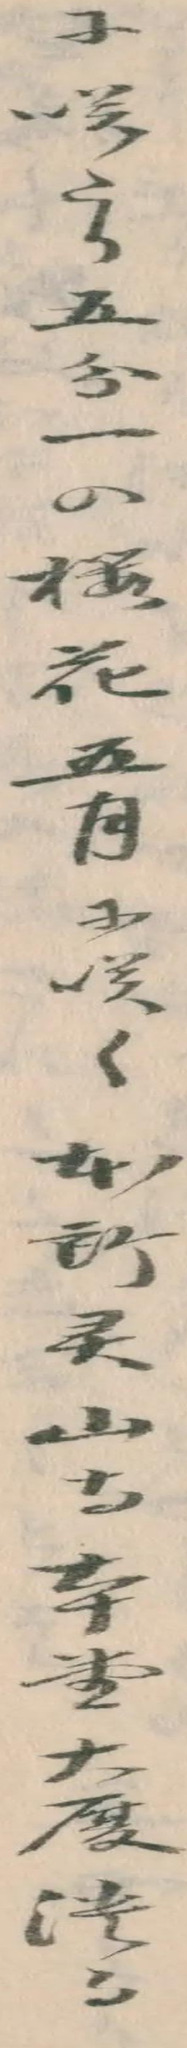に咲たり五分一の桜花五月に咲く本所霊山寺本堂大厦潰る
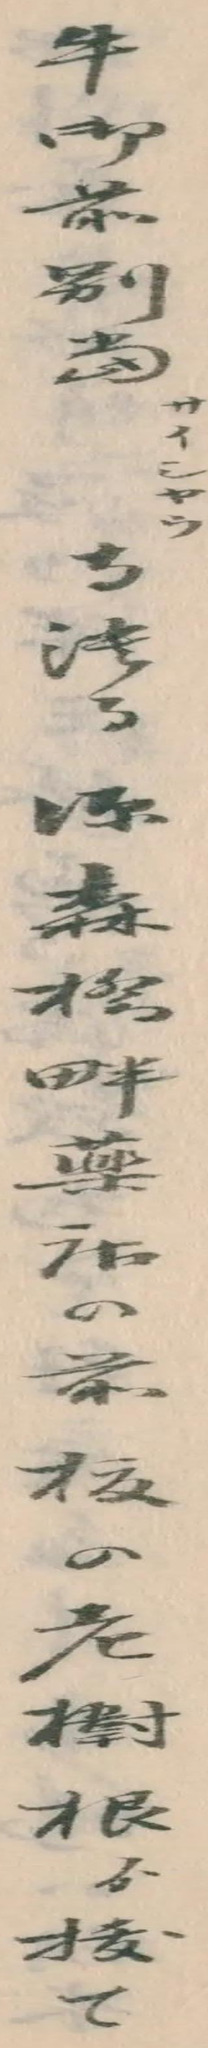牛御前別当サイシヤウ寺潰る源森橋畔薬店の前榎の老樹根ゟ抜て
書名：地災撮要. 巻10(地震之部) 上,下
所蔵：国立国会図書館 National Diet Library, JAPAN
